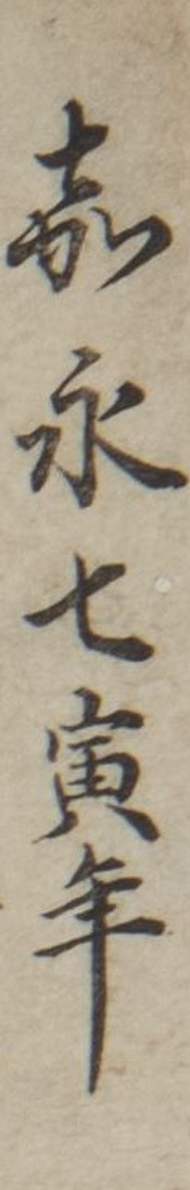嘉永七寅年
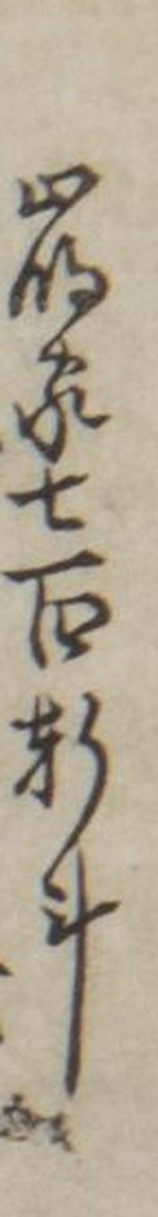崩家七百軒計
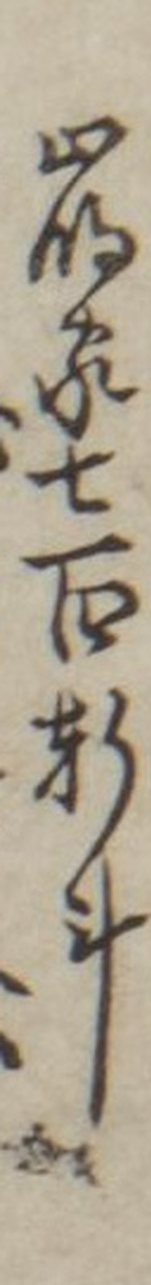崩家七百軒計
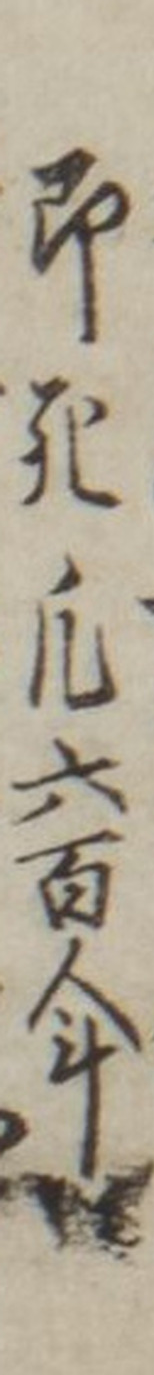即死凡六百人計
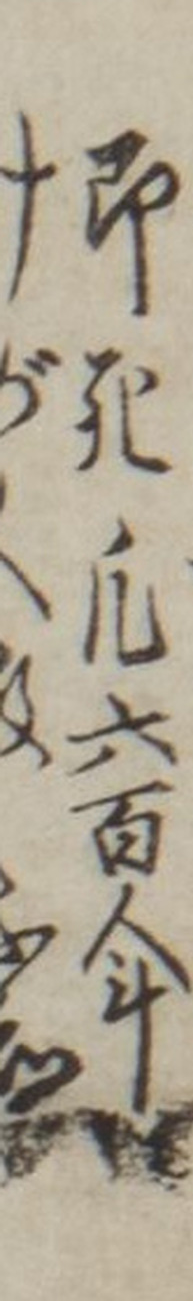即死凡六百人計
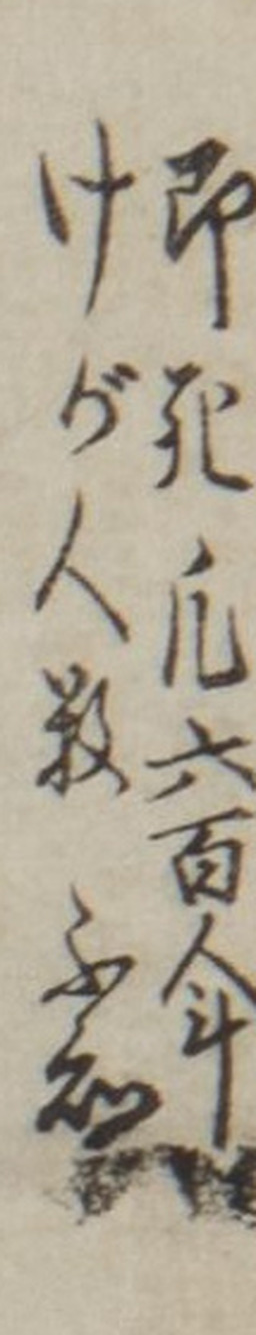けが人数不知
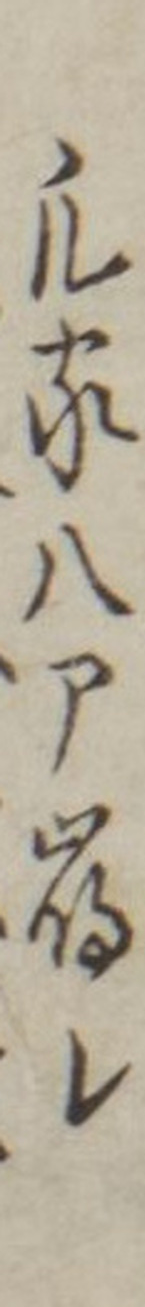凡家八部崩れ
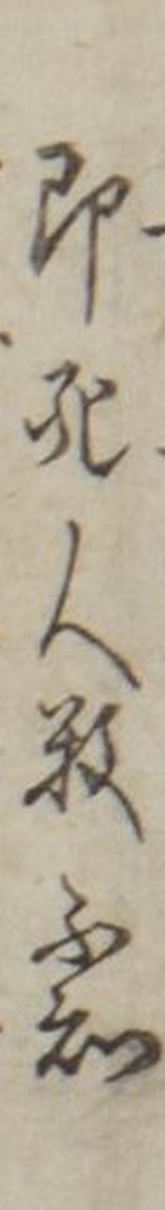即死人数不知
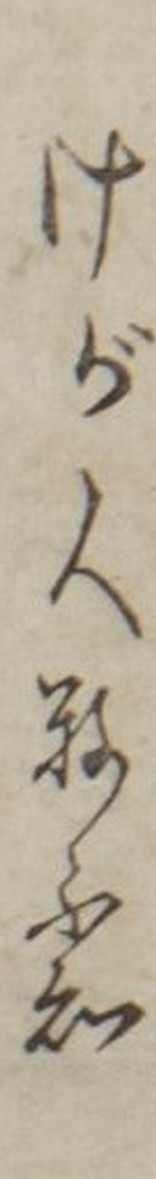けが人数不知
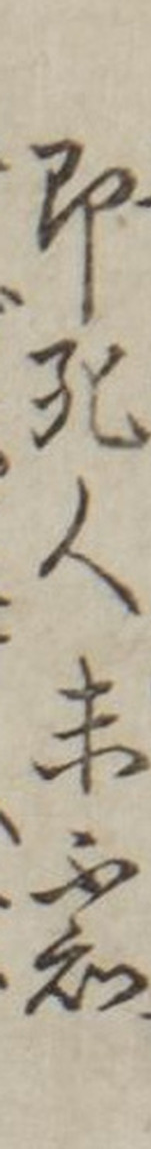即死人数不知
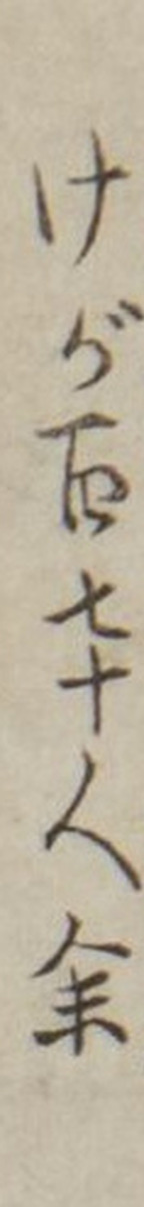けが百七十人余
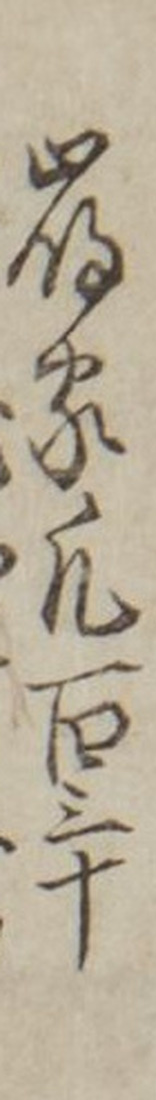崩家凡百三十
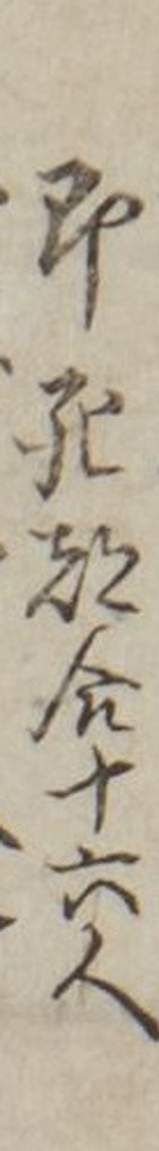水口即死都合十六人
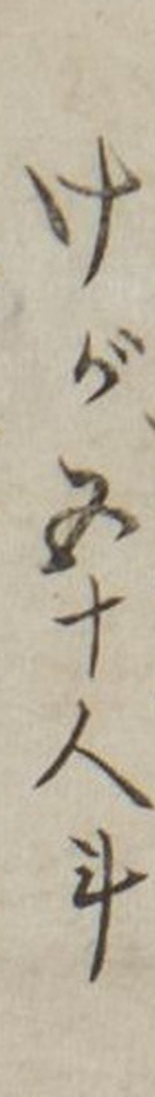けが五十人計
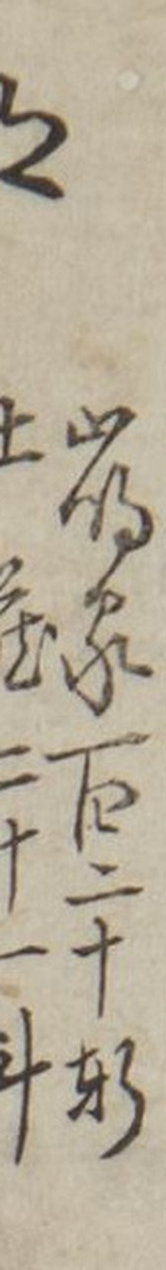崩家百二十軒
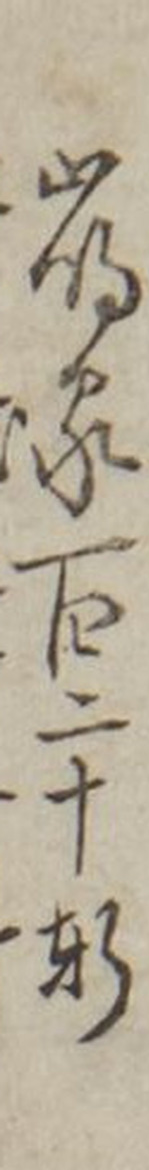崩家百二十軒
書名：嘉永七寅年大地震記
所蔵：あいおいニッセイ同和損保株式会社
